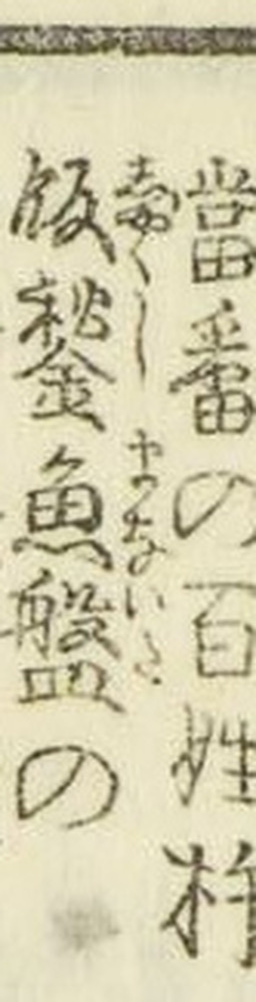飯鍬魚盤の
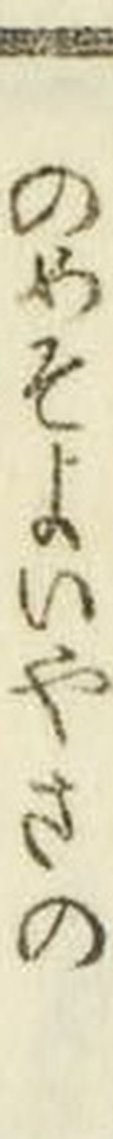のめそよいやさの
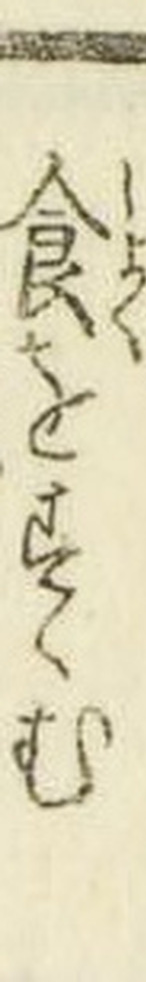食をすゝむ
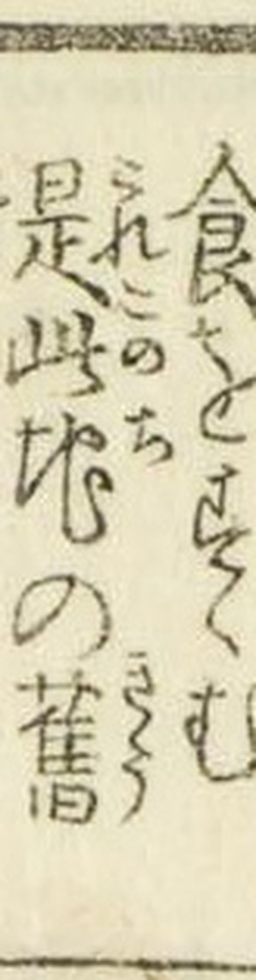是此地の旧
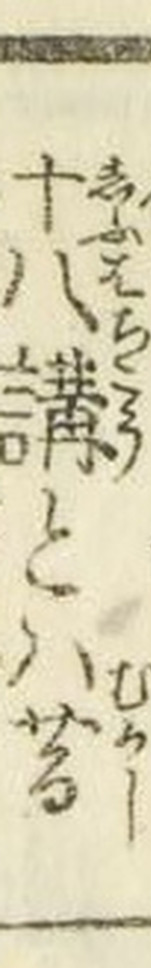十八講とは昔
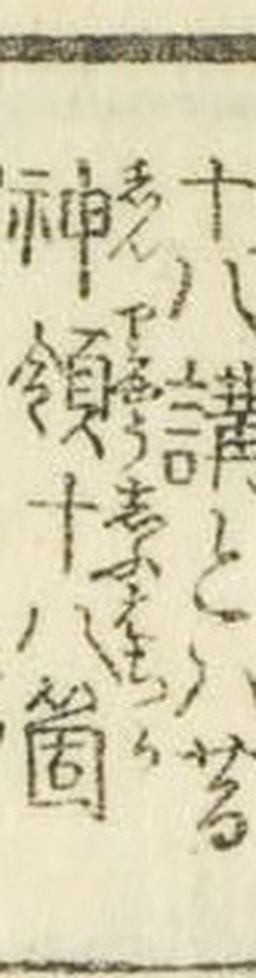神領十八箇
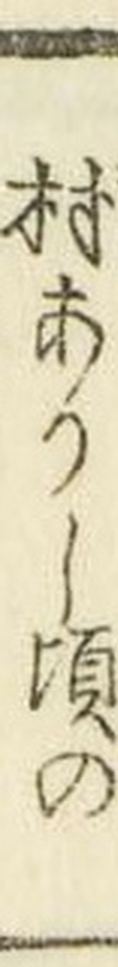村ありし頃の
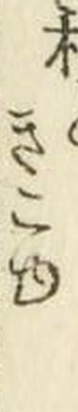きこゆ

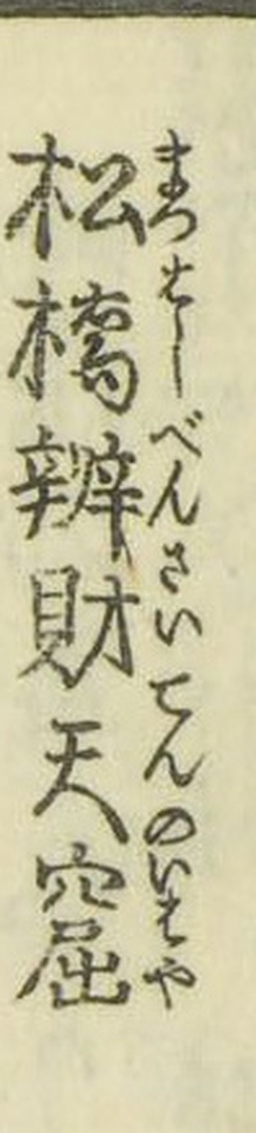松橋弁財天窟
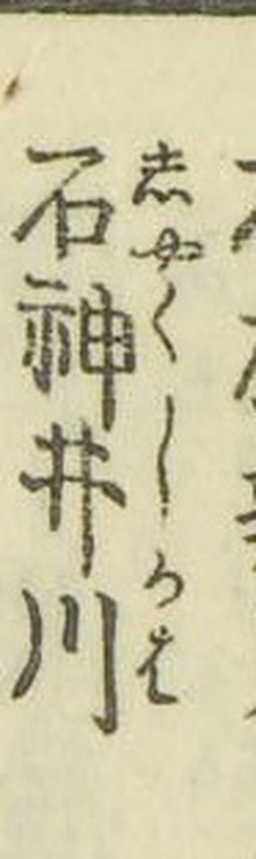石神井川

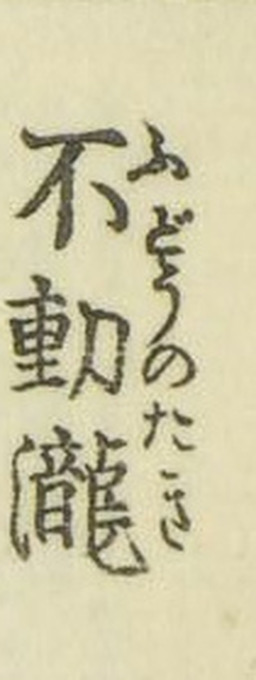不動滝
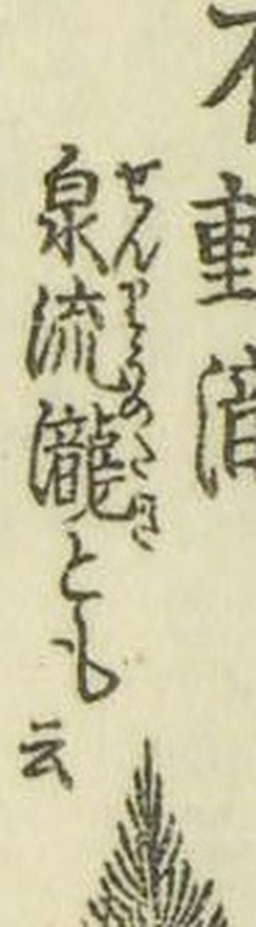泉流滝とも云
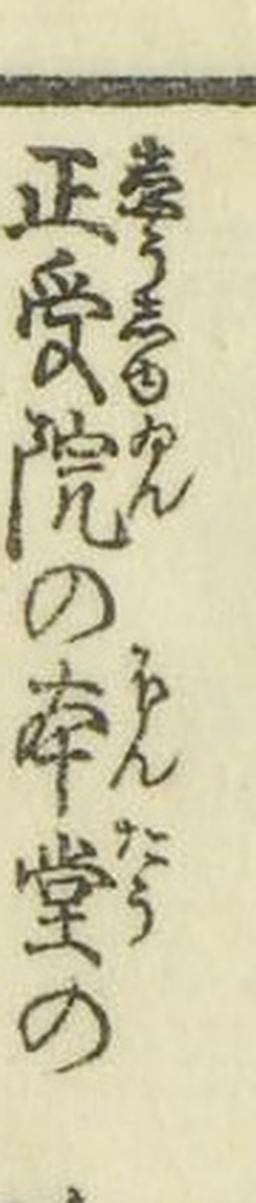正受院の本堂の
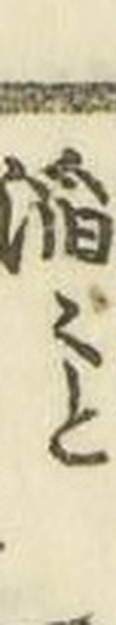滔々と
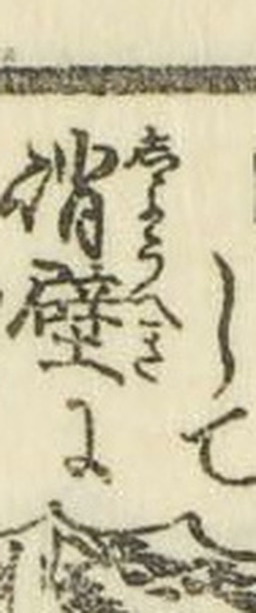峭壁に
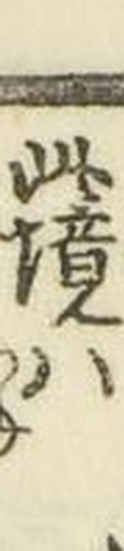此境は
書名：江戸名所図会 20巻 巻之15
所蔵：東京学芸大学教育コンテンツアーカイブ
